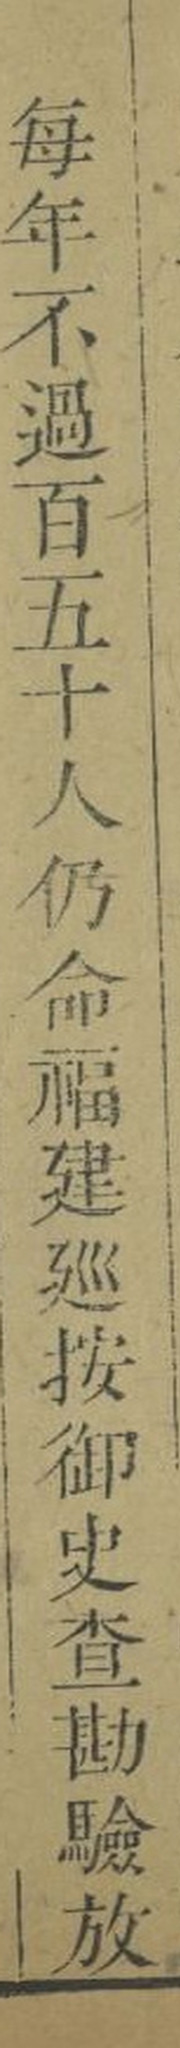毎年不過百五十人仍命福建巡按御史査勘験放
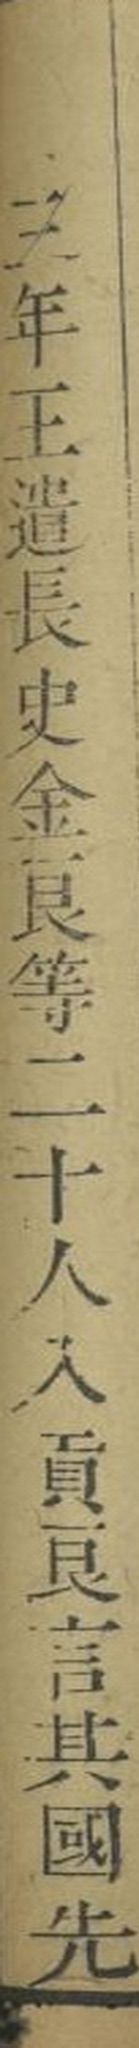三年王遣長史金良等二十人入貢良言其国先
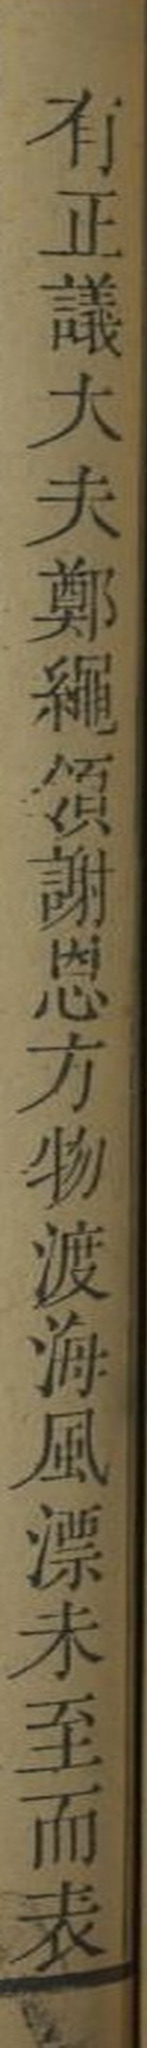有正議大夫鄭縄領謝恩方物渡海風漂未至而表
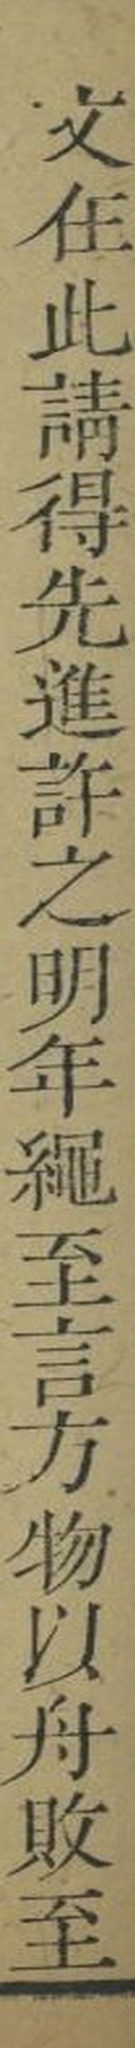文在此請得先進許之明年縄至言方物以舟敗至
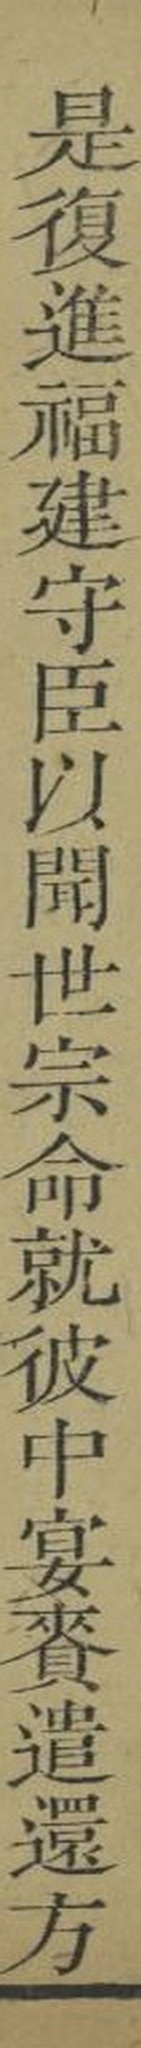是復進福建守臣以聞世宗命就彼中宴賚遣還方
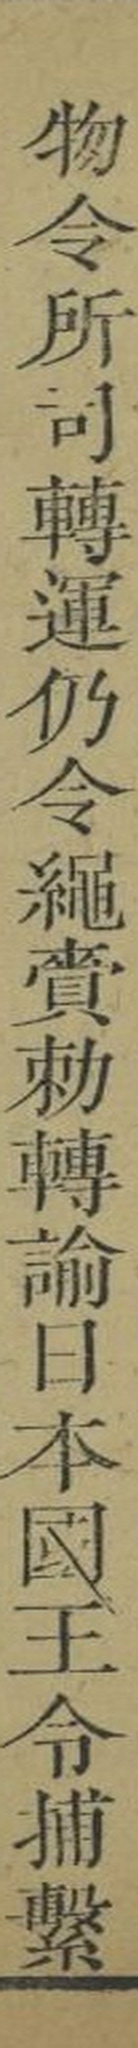物令所司転運仍令縄賚勅転諭日本国王令捕繋
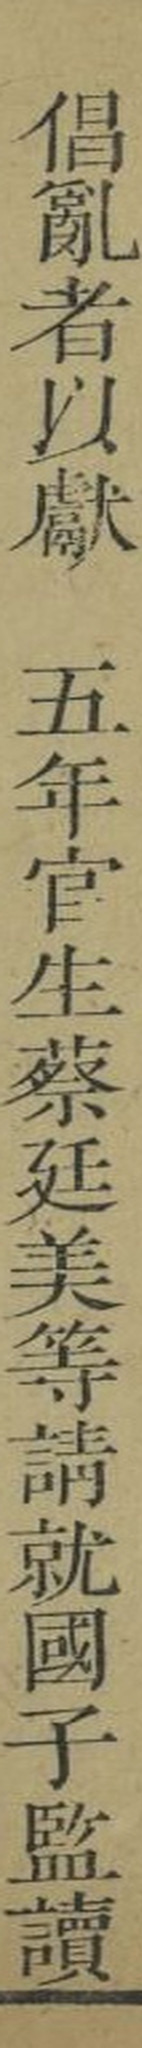倡乱者以献五年官生蔡廷美等請就国子監読
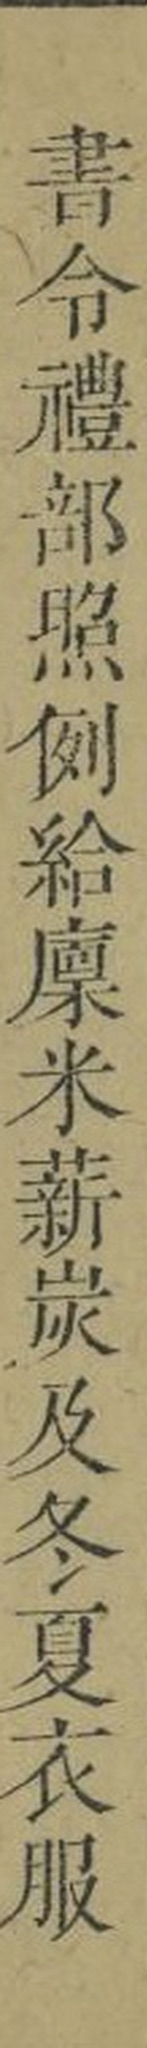書令礼部照例給廩米薪炭及冬夏衣服
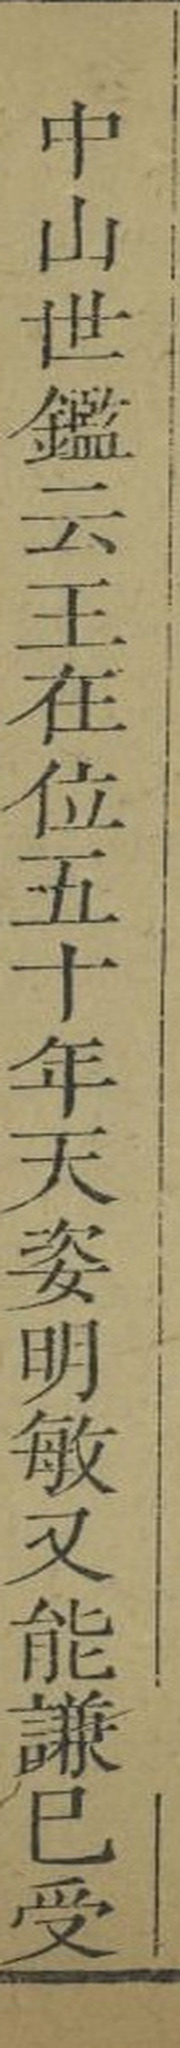中山世鑑云王在位五十年天姿明敏又能謙巳受
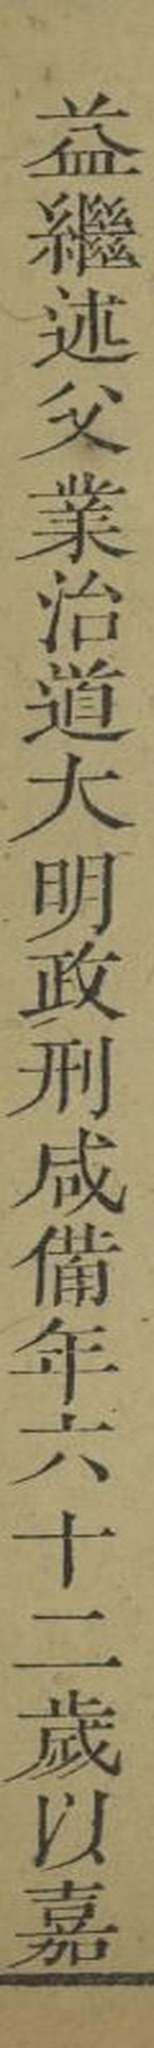益継述父業治道大明政刑咸備年六十二歳以嘉
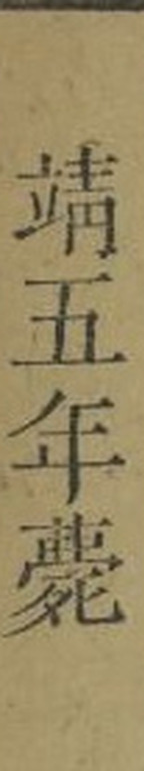靖五年薨

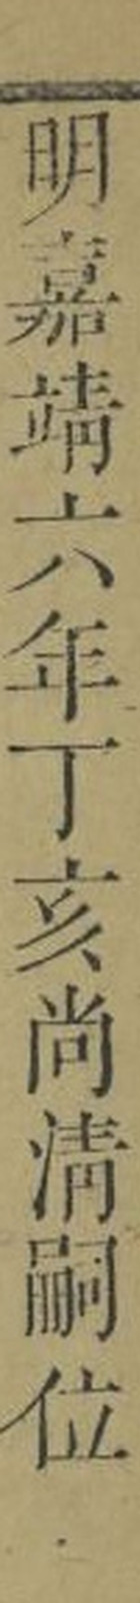明嘉靖六年丁亥尚清嗣位
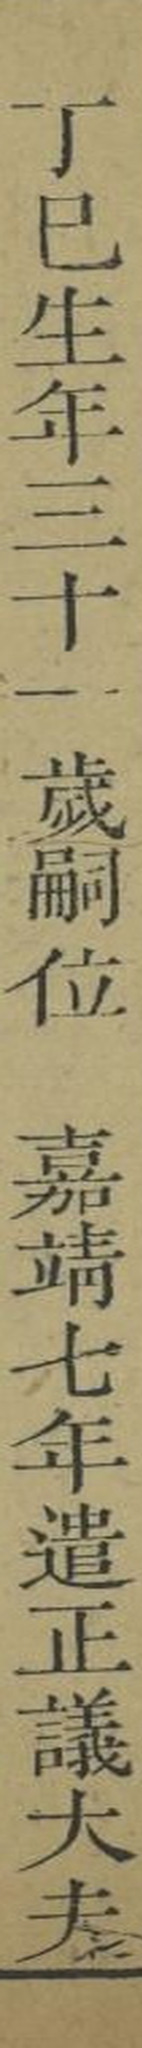丁巳生年三十一歳嗣位嘉靖七年遣正議大夫
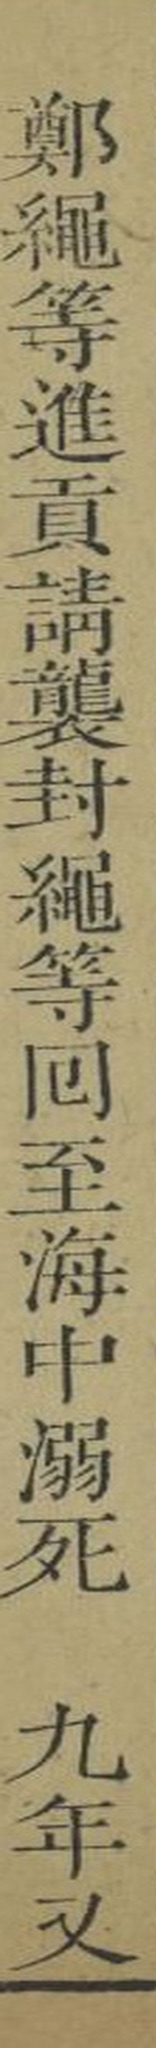鄭縄等進貢請襲封縄等回至海中溺死九年又
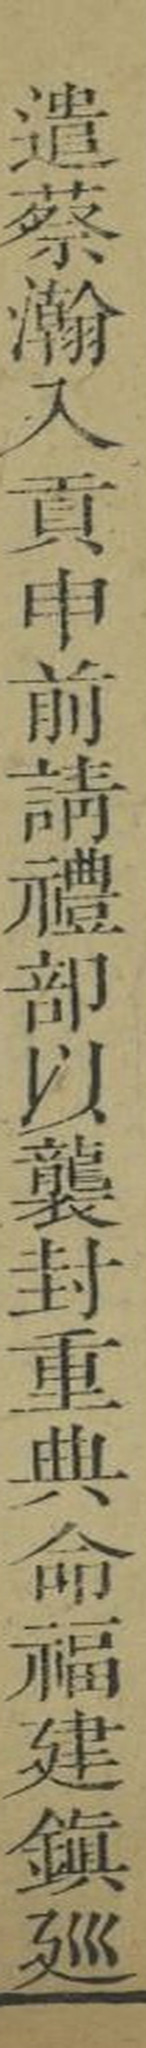遣蔡瀚入貢申前請礼部以襲封重典命福建鎮巡
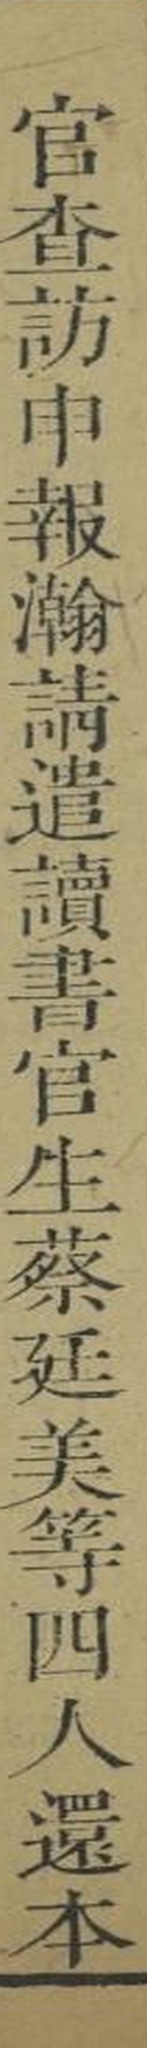官査訪申報瀚請遣読書官生蔡廷美等四人還本
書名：中山伝信録 巻三
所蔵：University of the Ryukyus Library
